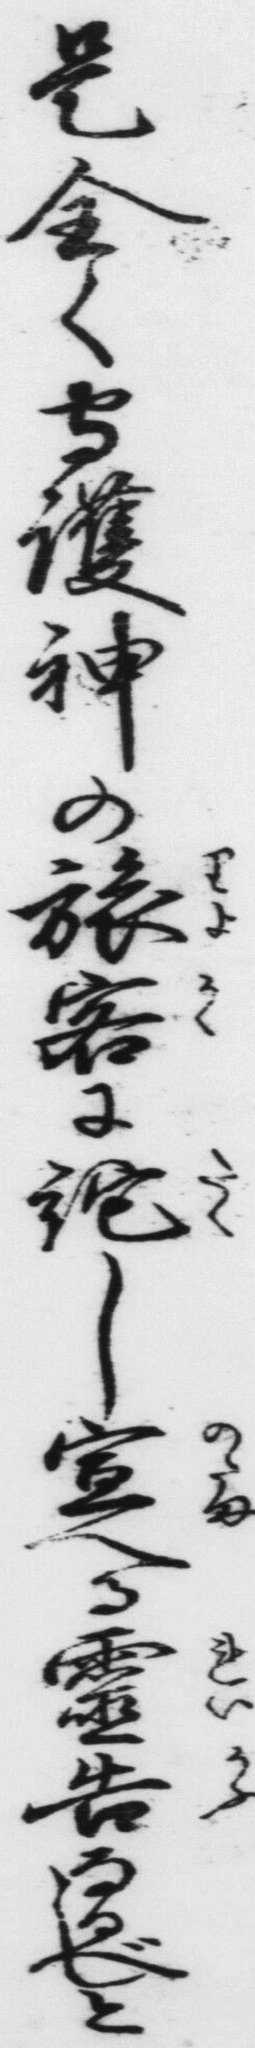是全く守護神の旅客に詑し宣へる霊告なるべしと
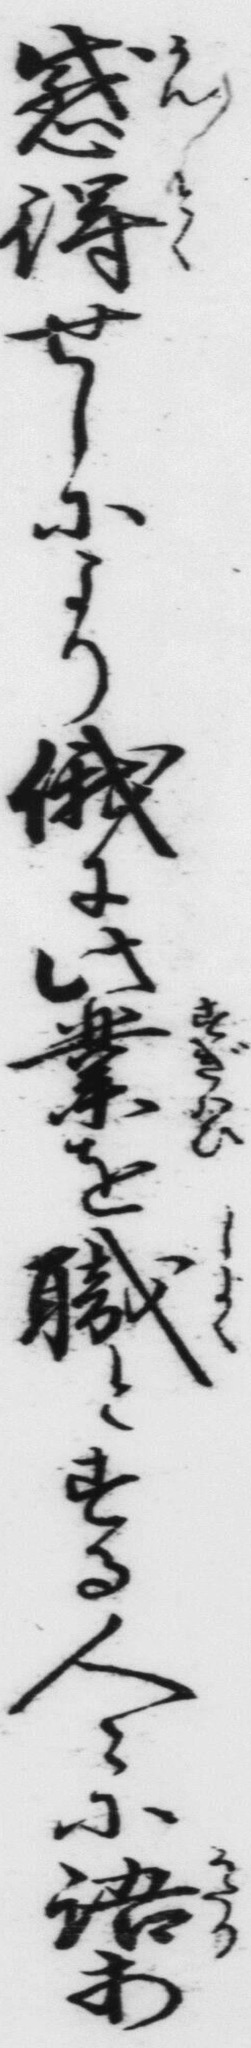感得せしにより俄に此業を職とする人々に語あ

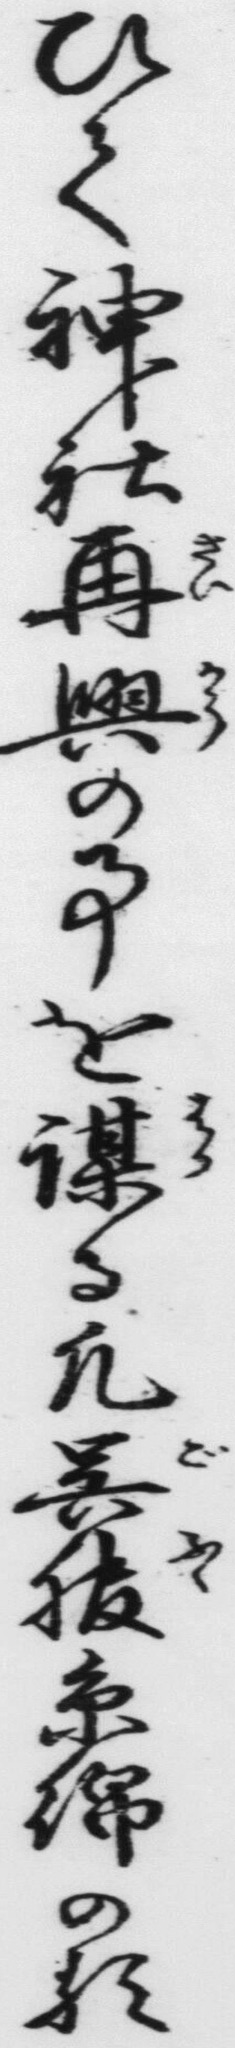ひて神社再興の事を謀る凡呉服糸綿の類
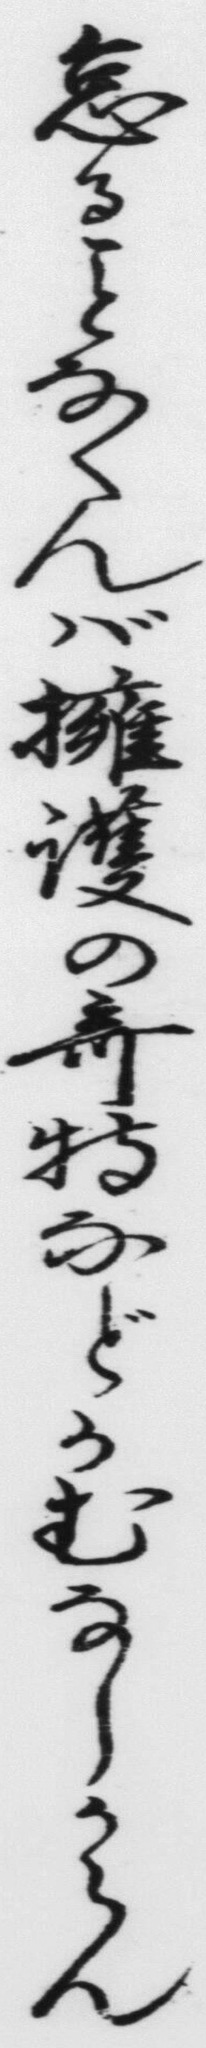怠ることなくんば擁護の奇特などかむなしからん
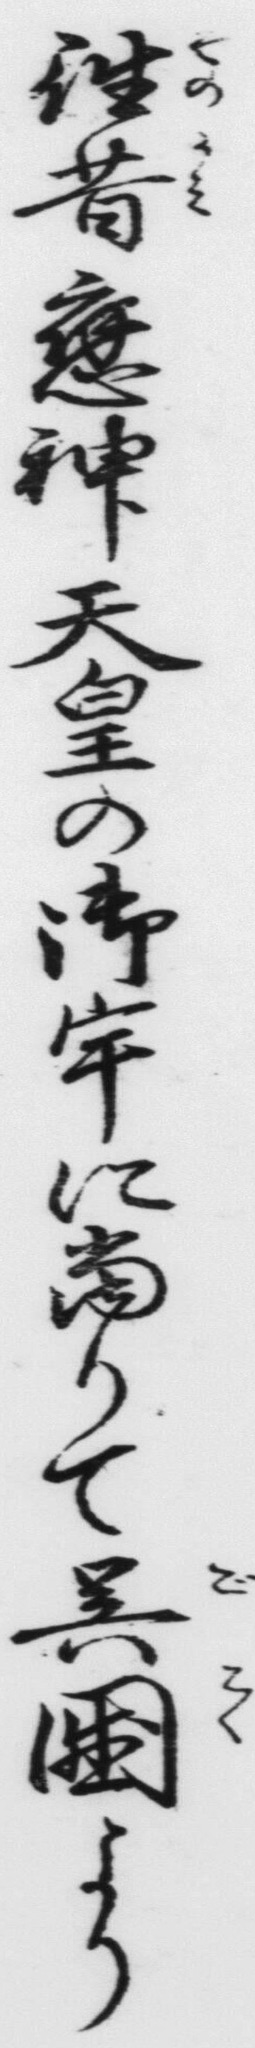往昔応神天皇の御宇に当りて呉国より
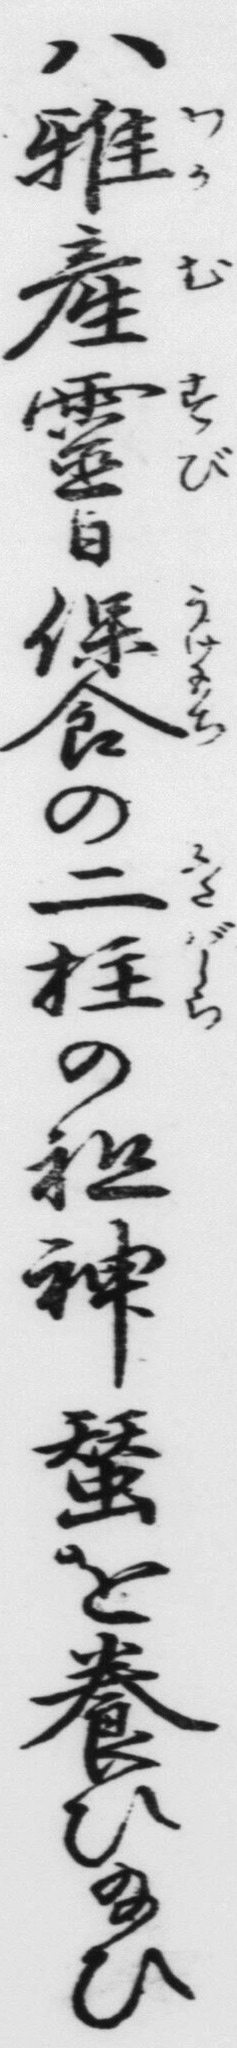は雅産霊日保食の二柱の租神蚕を養ひ給ひ
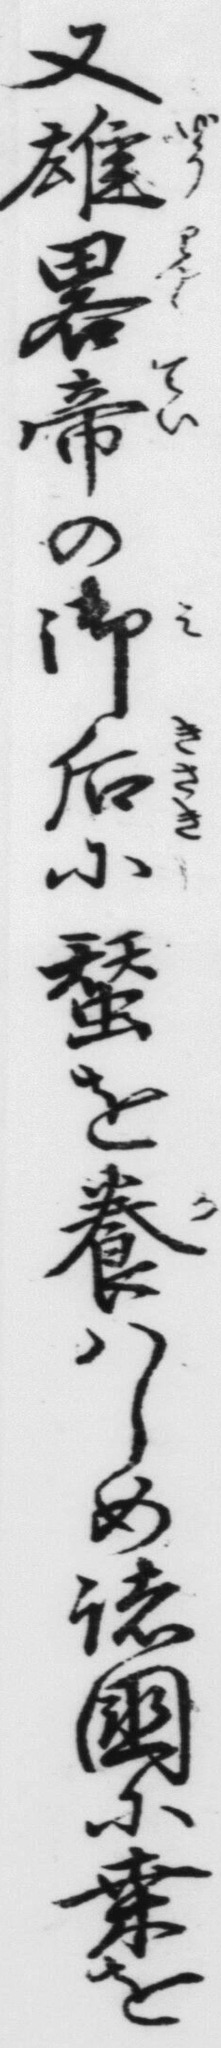又雄略帝の御后に蚕を養はしめ諸国に葉を
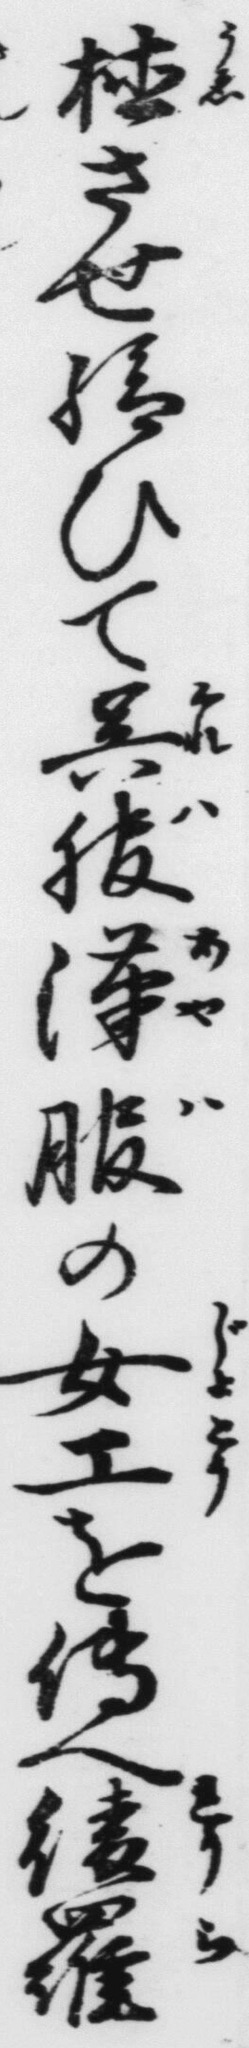植させ給ひて呉服漢服の女工を伝へ綾羅
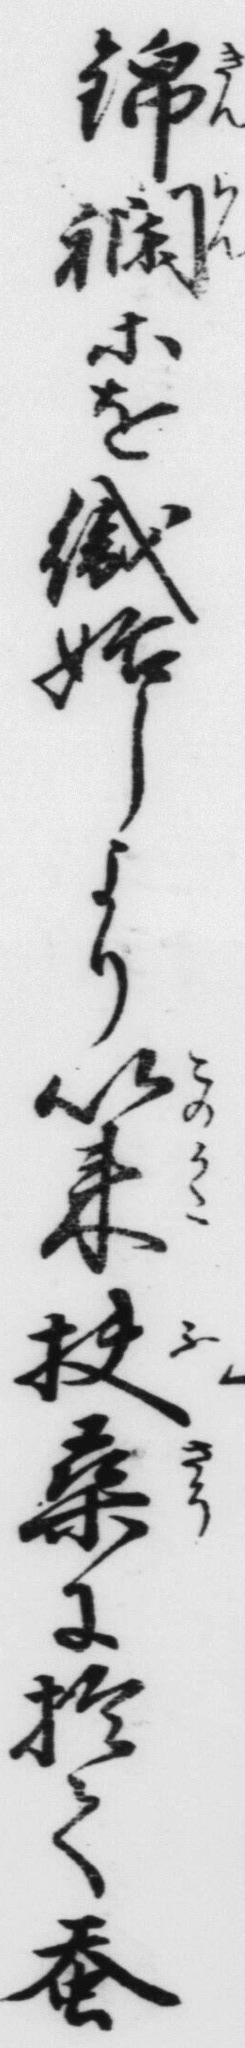錦欄等を織始しより以来扶桑に於て蚕
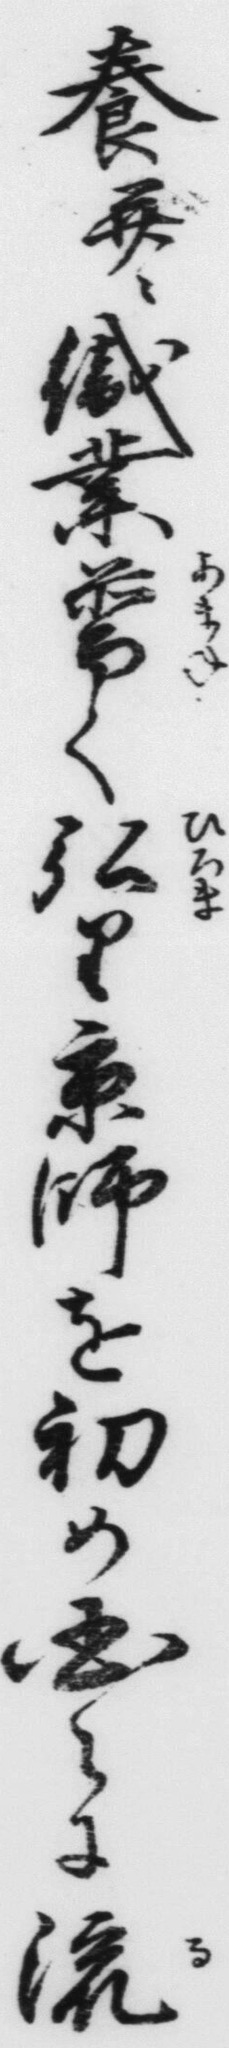養并に織業普く弘り京師を初め国々に流
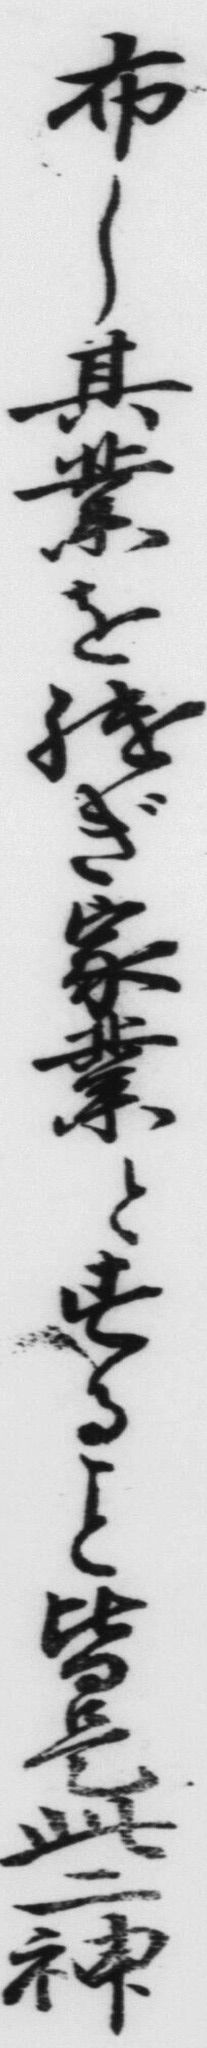布し其業を継ぎ家業とすること皆是此二神
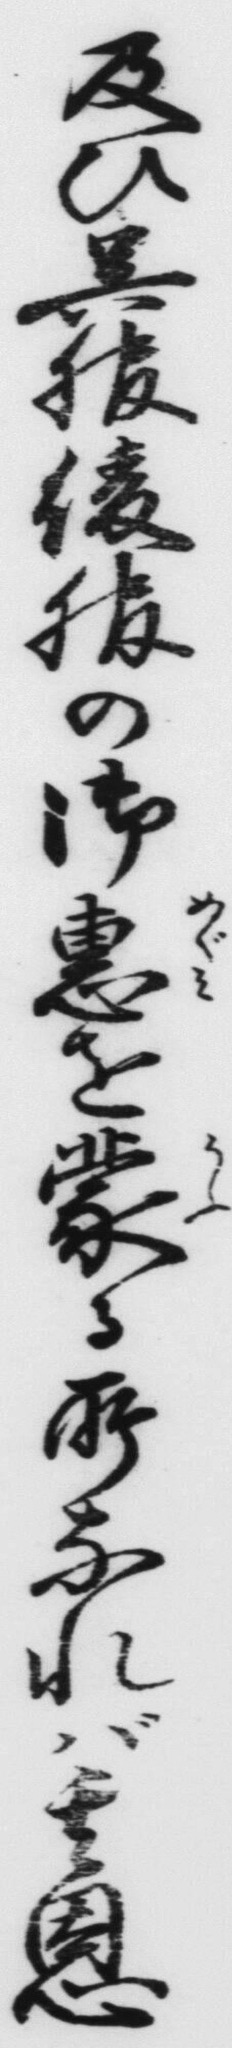及ひ呉服綾服の御恵を蒙る所なれば其恩
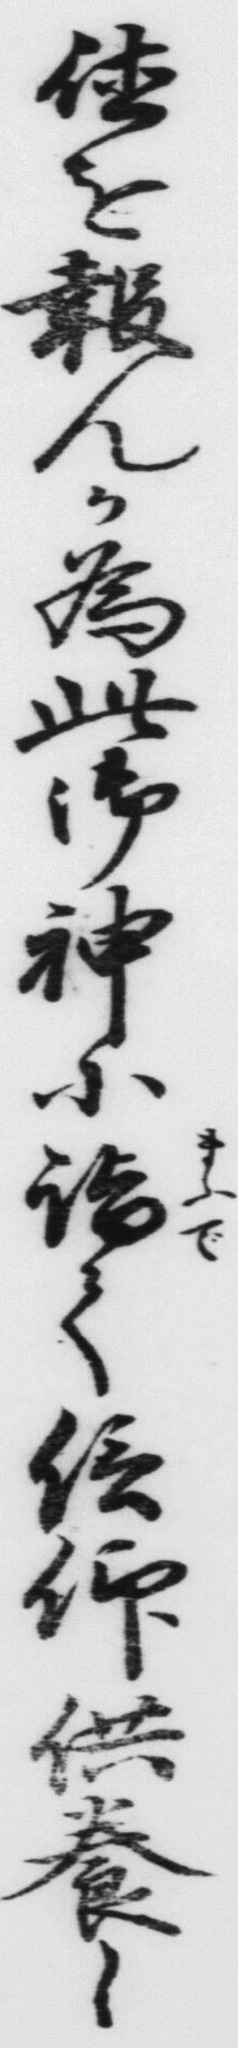徳を報んか為此御神に詣て信仰供養し
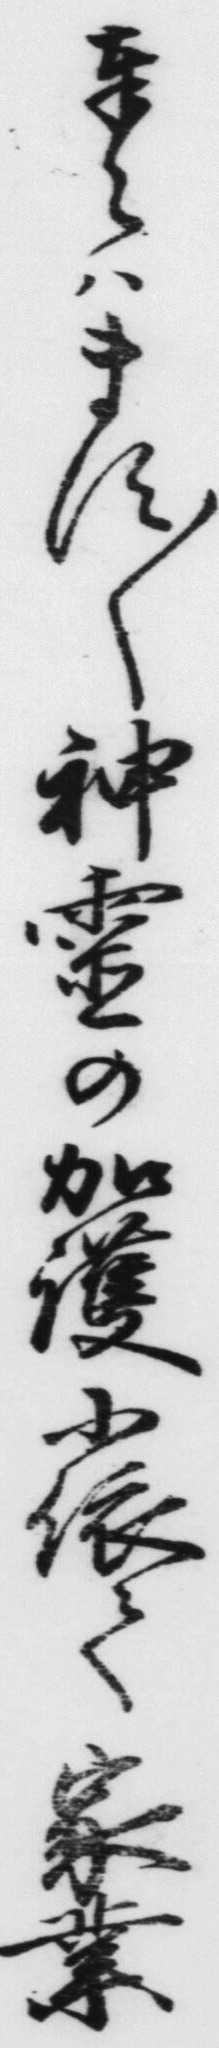奉らはますます神霊の加護に依て家業
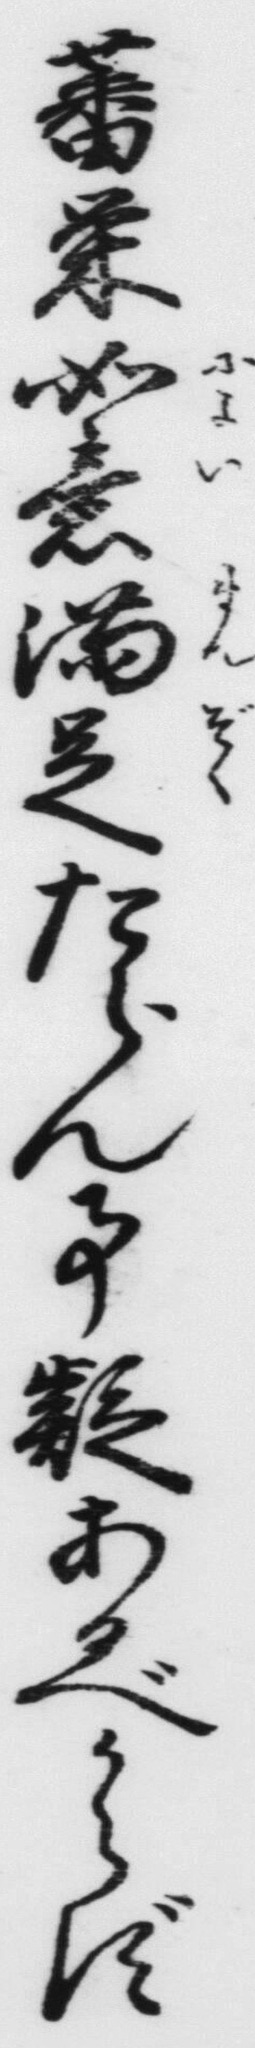蕃栄如意満足たらん事疑あるべからず

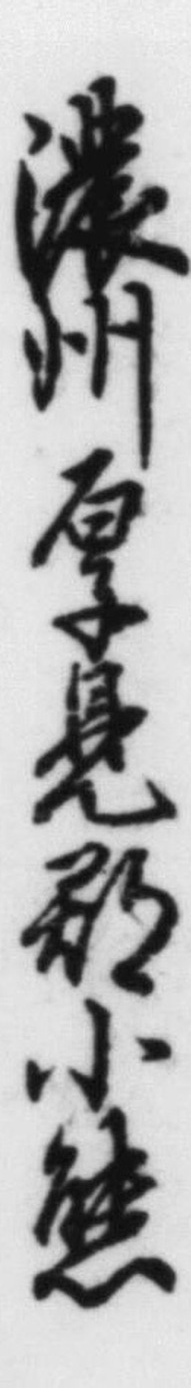濃州厚見郡小熊
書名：蚕養守護神畧縁起
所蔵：岐阜県図書館 国文学研究資料館
